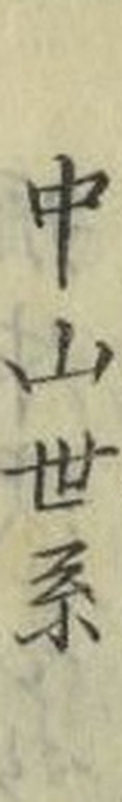中山世系
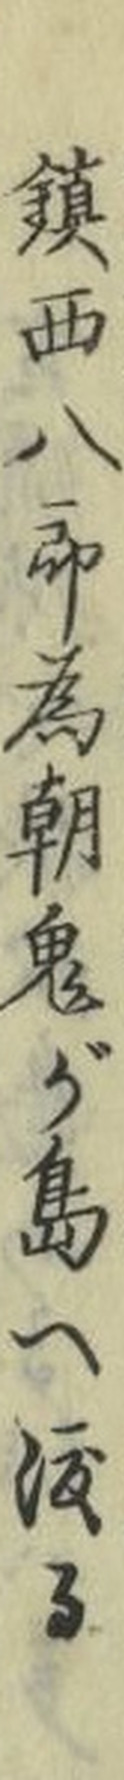鎮西八郎為朝鬼が島へ渡る
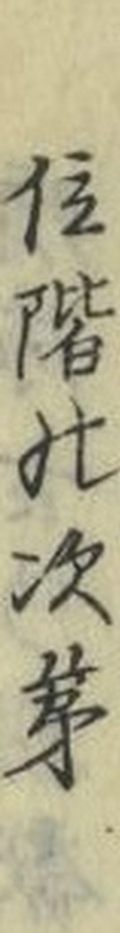位階の次第
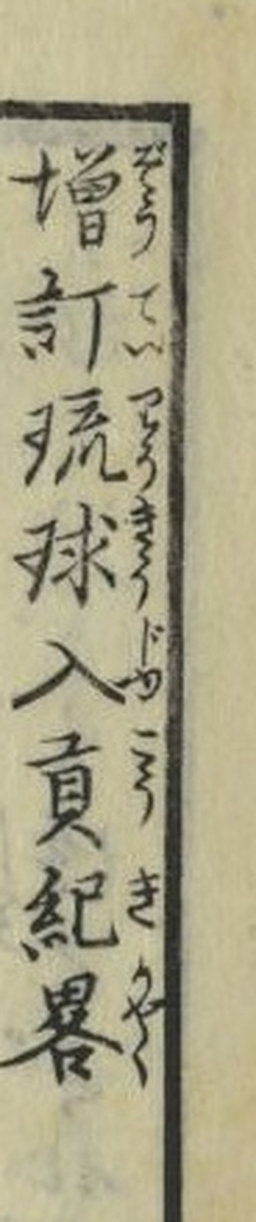増訂琉球入貢紀略
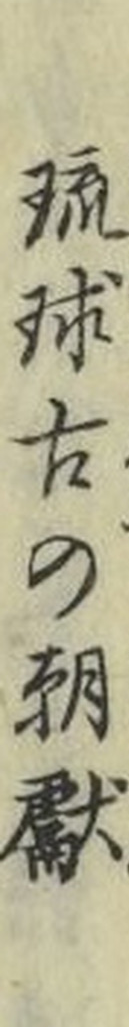琉球古の朝献
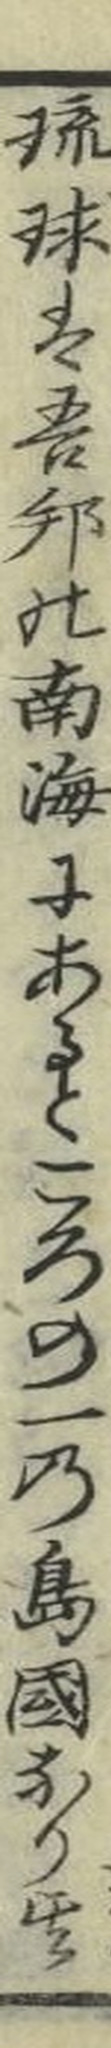琉球は吾邦の南海にあるところの一の島国なり、其
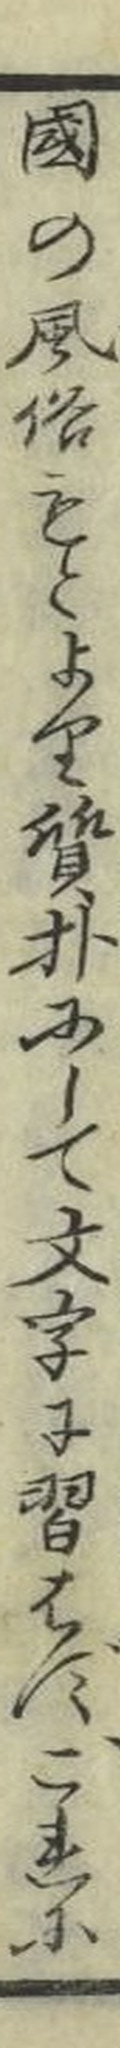国の風俗もとより質朴にして文字に習はず、これに
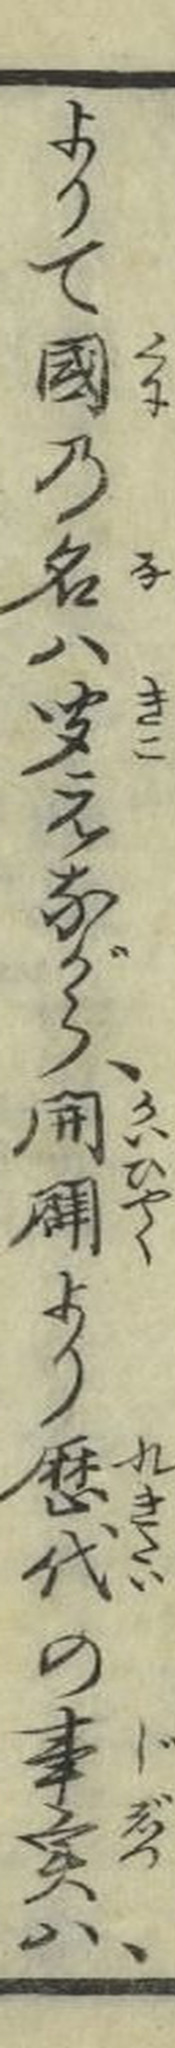よりて国の名は聞えながら、開闢より歴代の事実は、
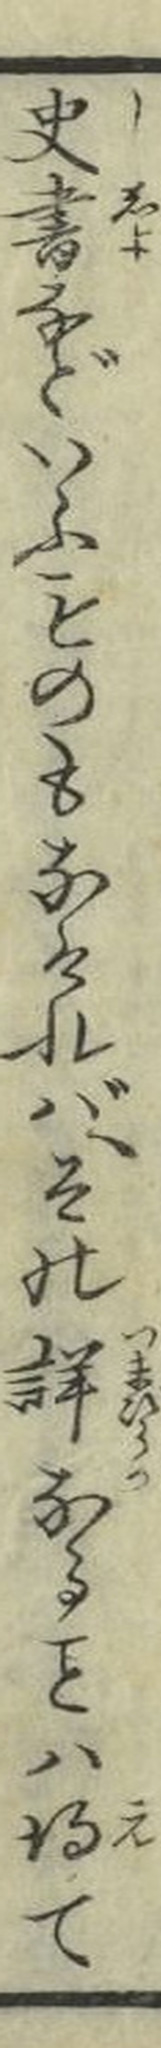史書などいふものもなければ、その詳なることは得て
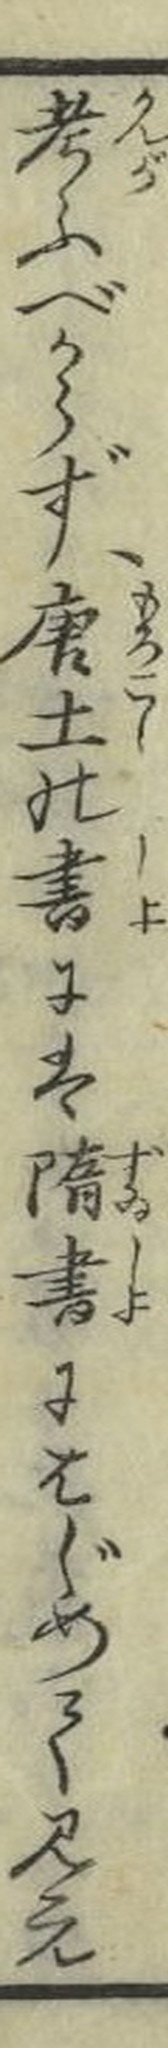考ふべからず、唐土の書には隋書にはじめて見え
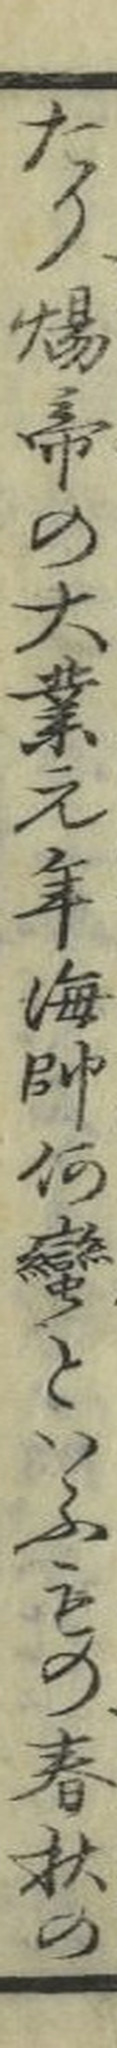たり、煬帝の大業元年海帥何蛮というもの、春秋の

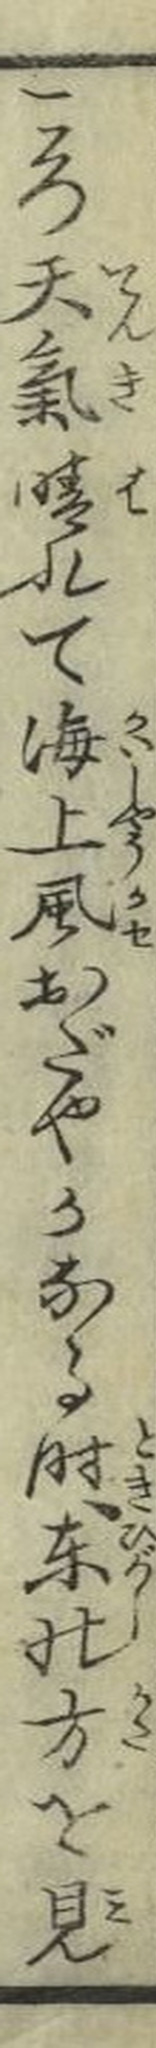ころ天気晴れて海上風おだやかなる時、東の方を見
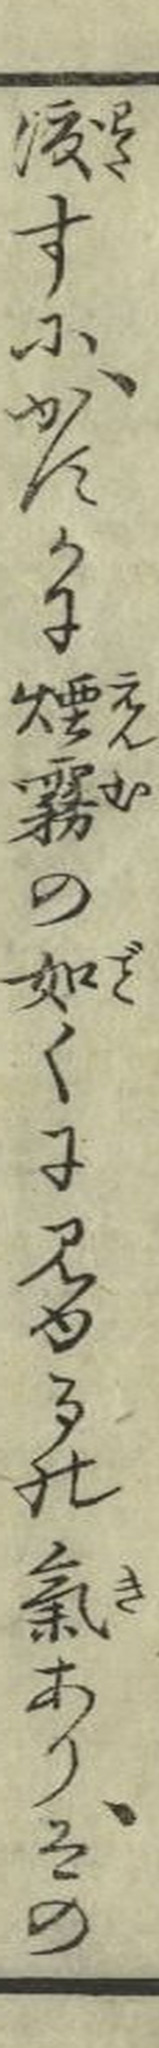渡すに、かすかに煙霧の如くに見ゆるの気あり、その
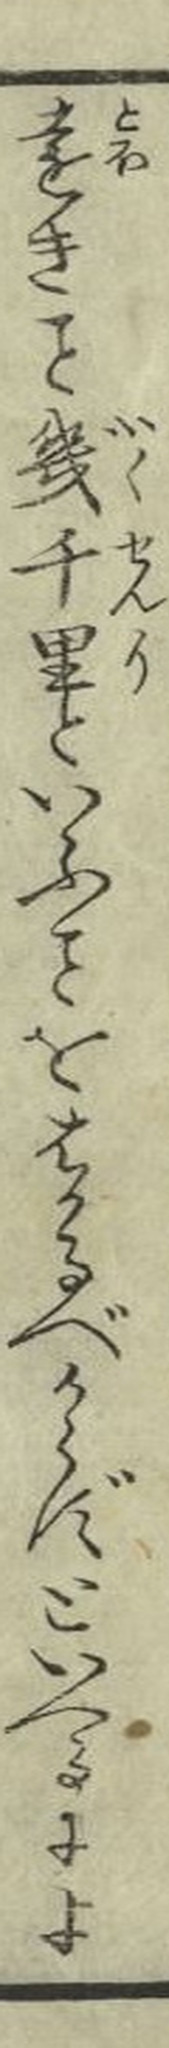遠きこと幾千里といふことをはかるべからずといへるによ
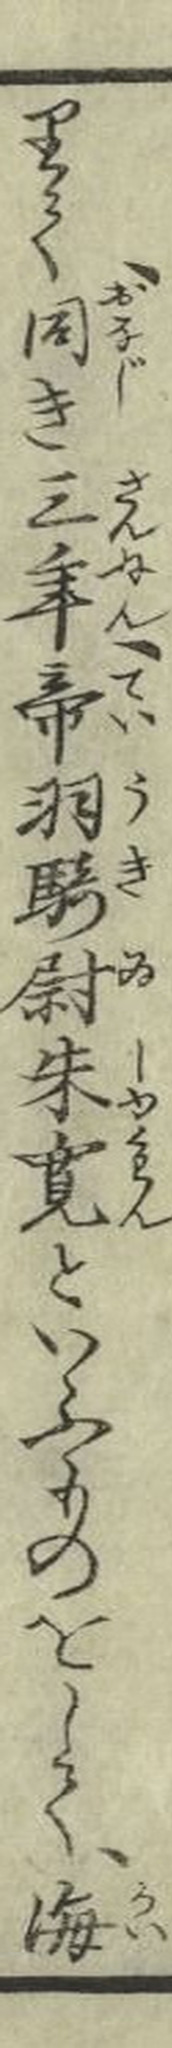りて、同き三年、帝羽騎尉朱寛といふものをして、海
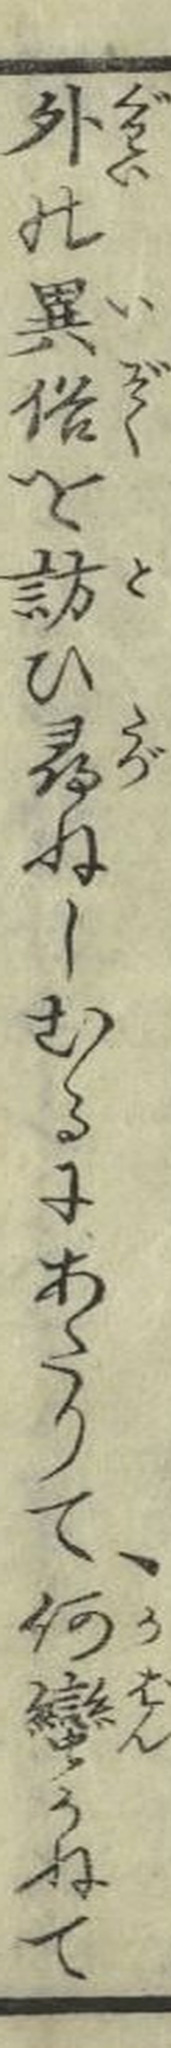外の異俗を訪ひ尋ねしむるにあたりて、何蛮かねて
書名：琉球入貢紀略
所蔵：University of the Ryukyus Library
